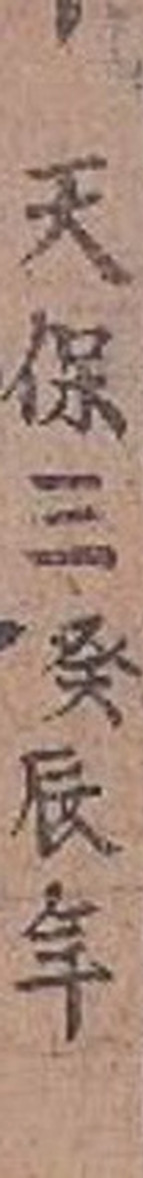天保三癸辰年
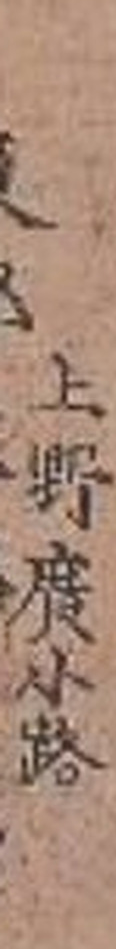上野広小路
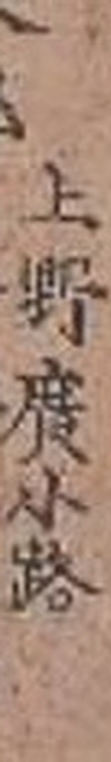上野広小路
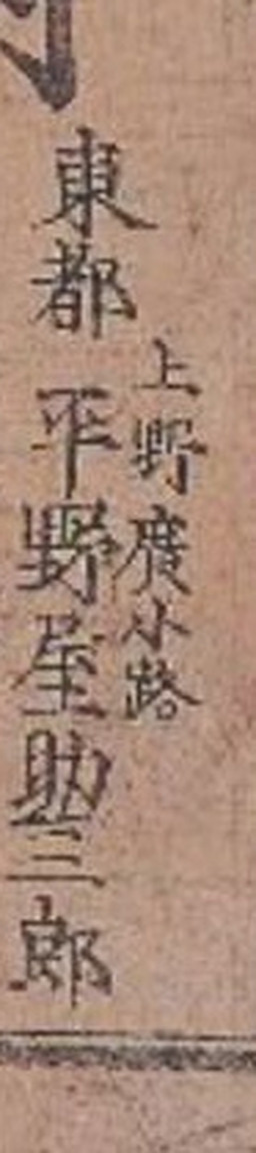東都平野屋助三郎
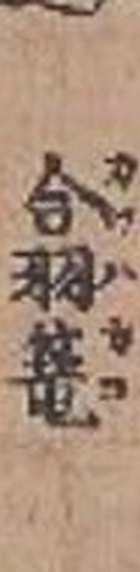合羽篭

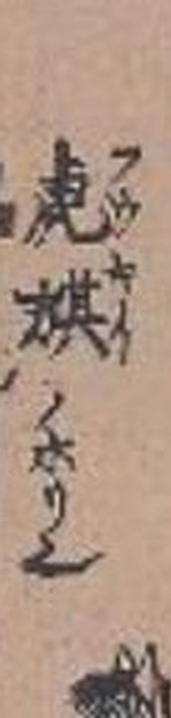虎旗ノホリ也

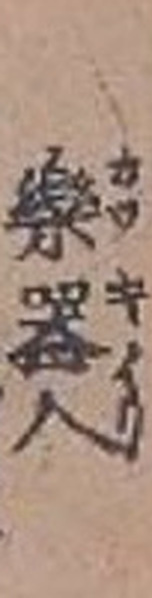楽器入
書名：琉球人行列附 天保三癸辰年
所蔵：University of the Ryukyus Library
